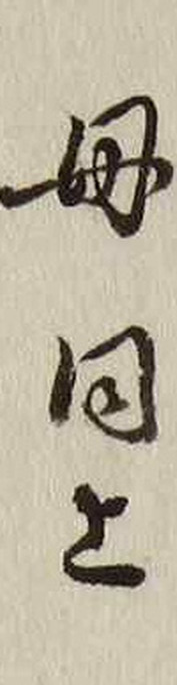母同上
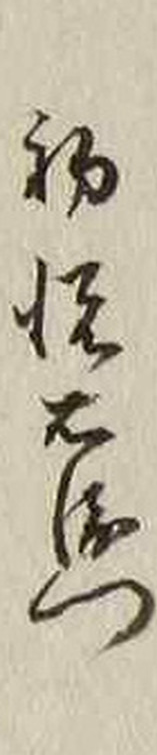初悦右衛門
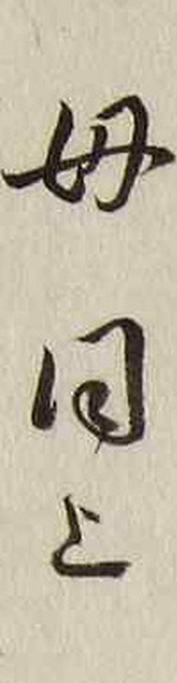母同上
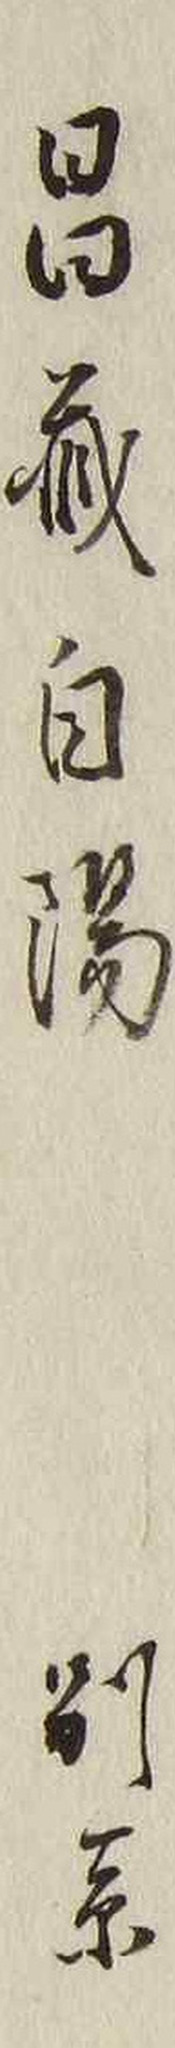昌蔵自陽別系

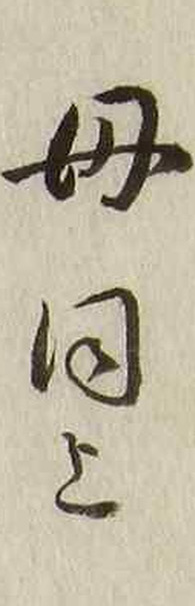母同上
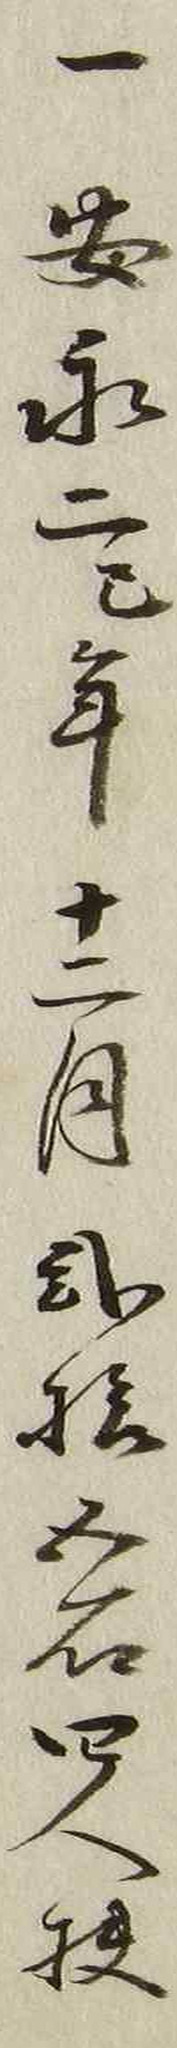一安永二巳年十二月弐拾五石四人扶
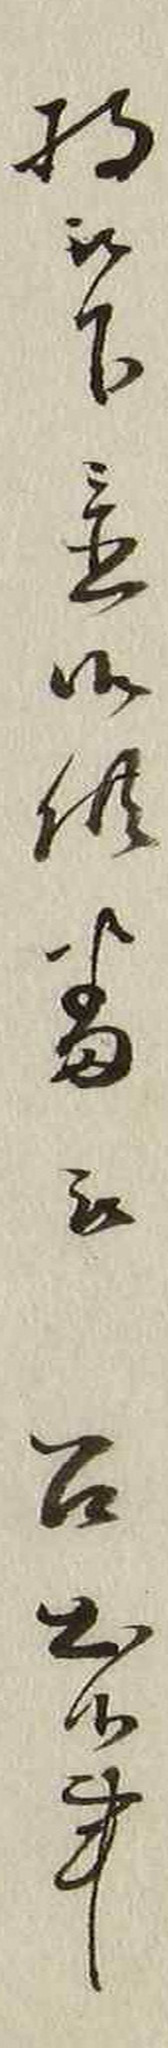知被下置御供番被召出候事
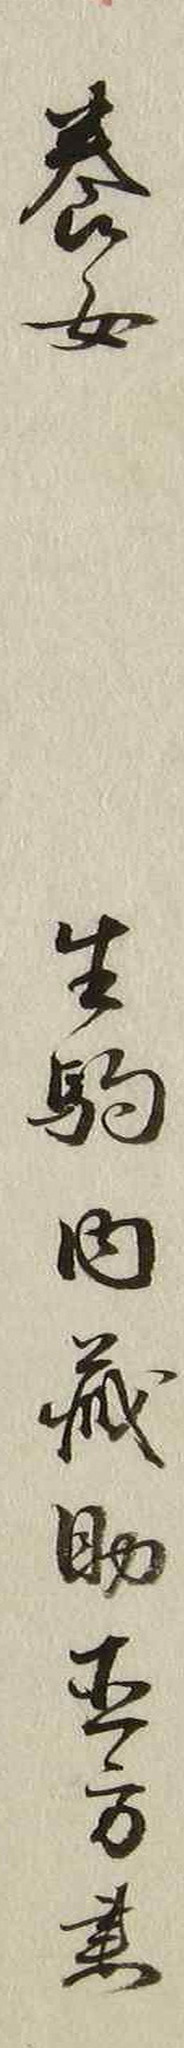養女生駒内蔵助直方妻
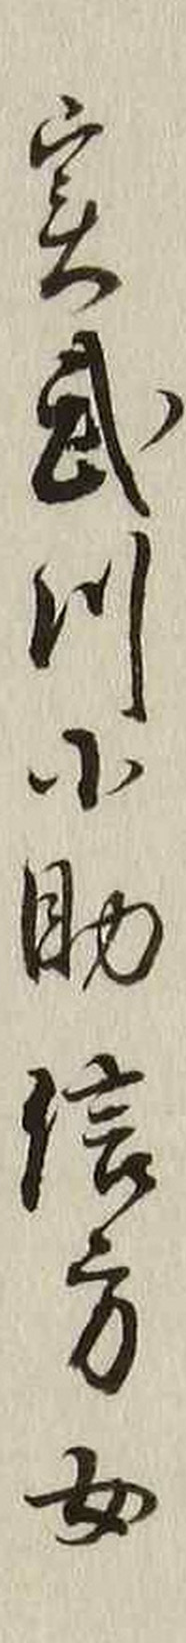実武川小助信方女
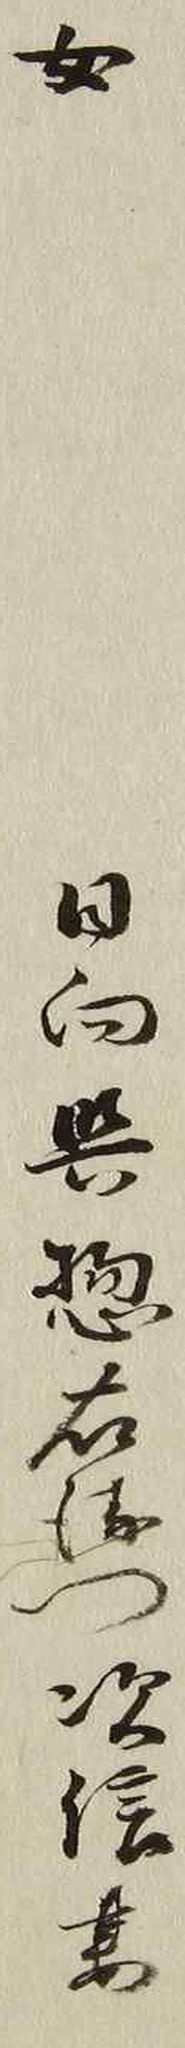女日向輿惣右衛門次信妻
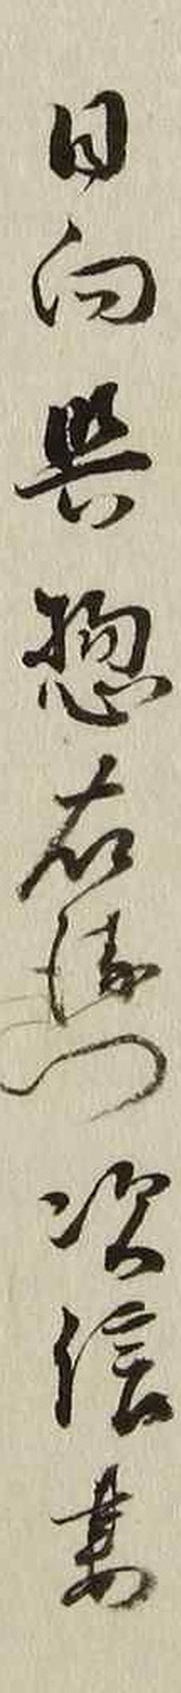女日向輿惣右衛門次信妻
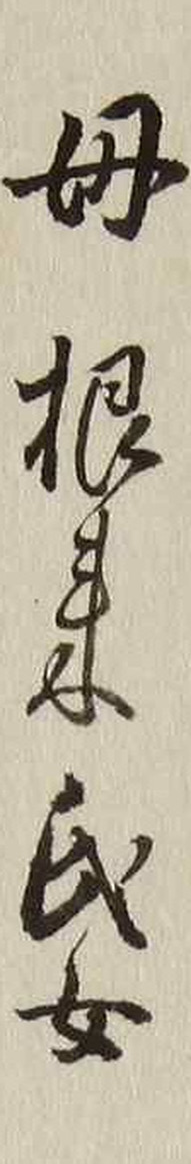母根来氏女
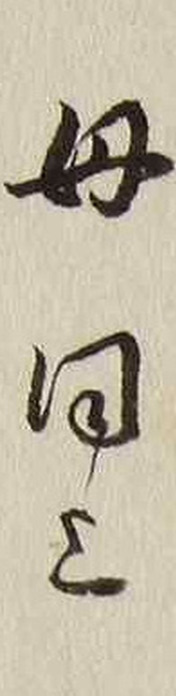母同上
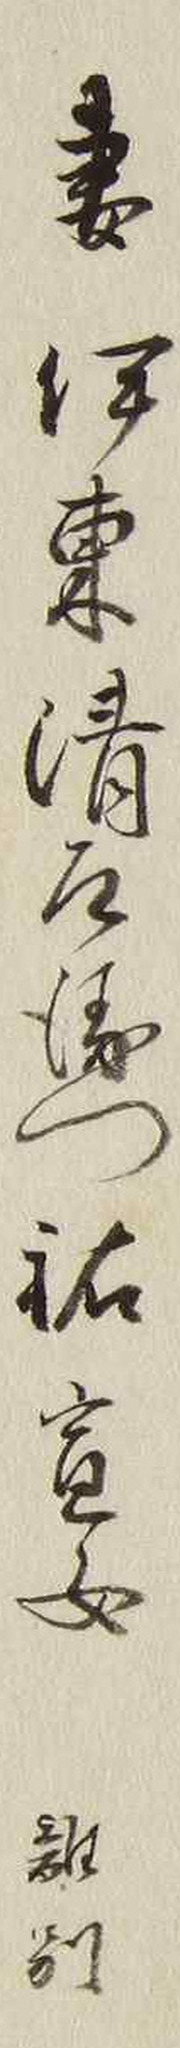妻伊東清左衛門祐宣女難別
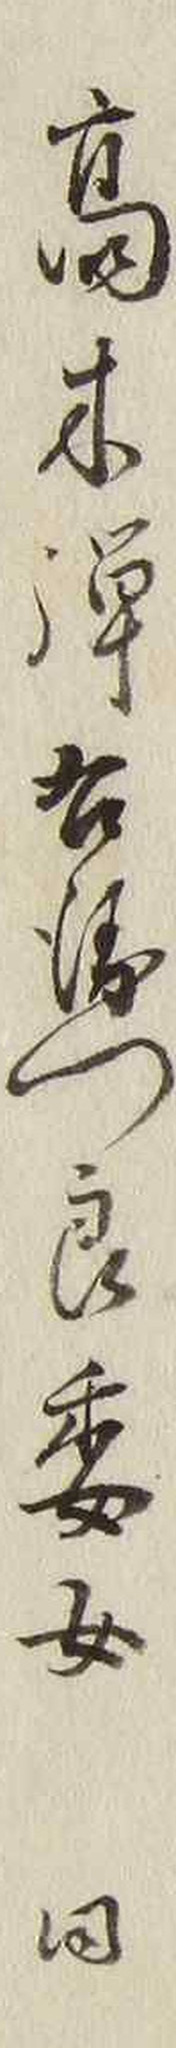高木弾右衛門良委女同

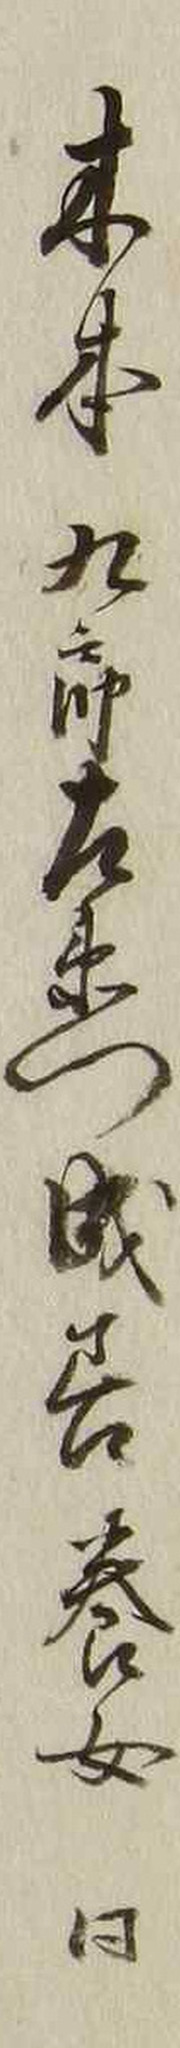木本九郎左衛門成善養女同
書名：諸士系譜　巻之159　な之部1
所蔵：会津若松市立会津図書館
